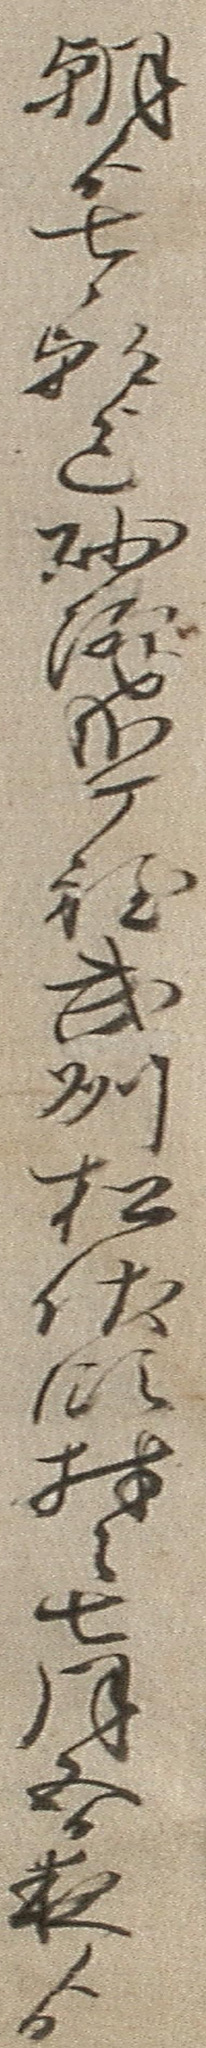朝ゟ七日朝迄砂降弐丁程武州松伏領村々七月五日夜ゟ
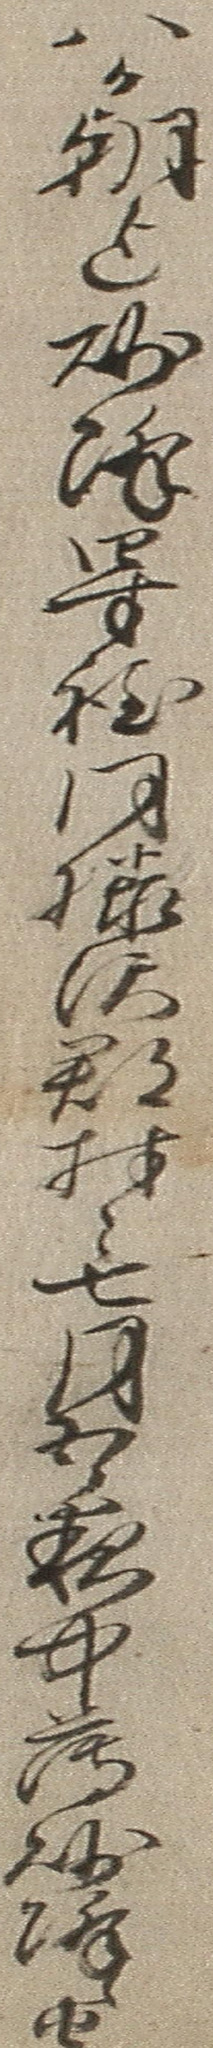八日朝迄砂降四寸程同榛沢郡村々七月五日夜中薄砂降候由
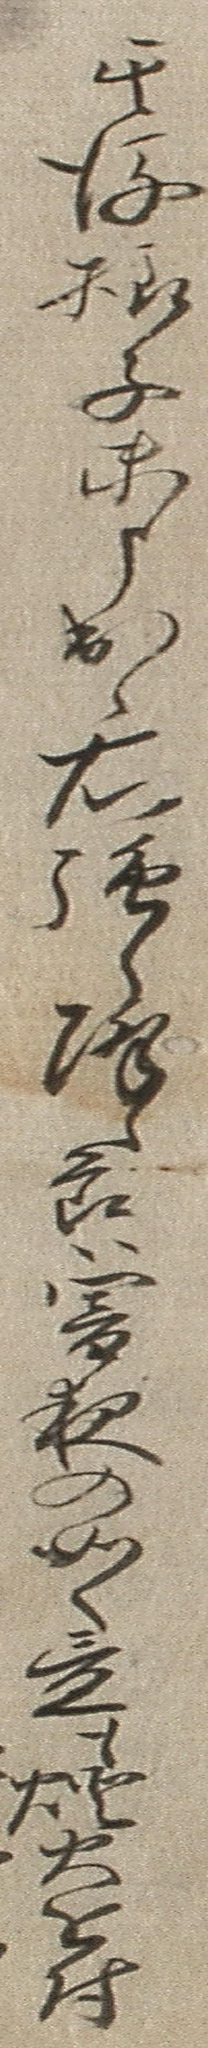其後様子未申出候右強く降候節は闇夜の如く昼も燈火を付
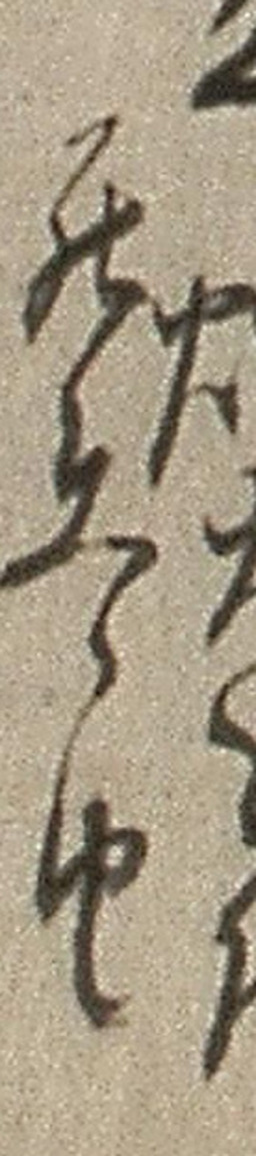罷在候由
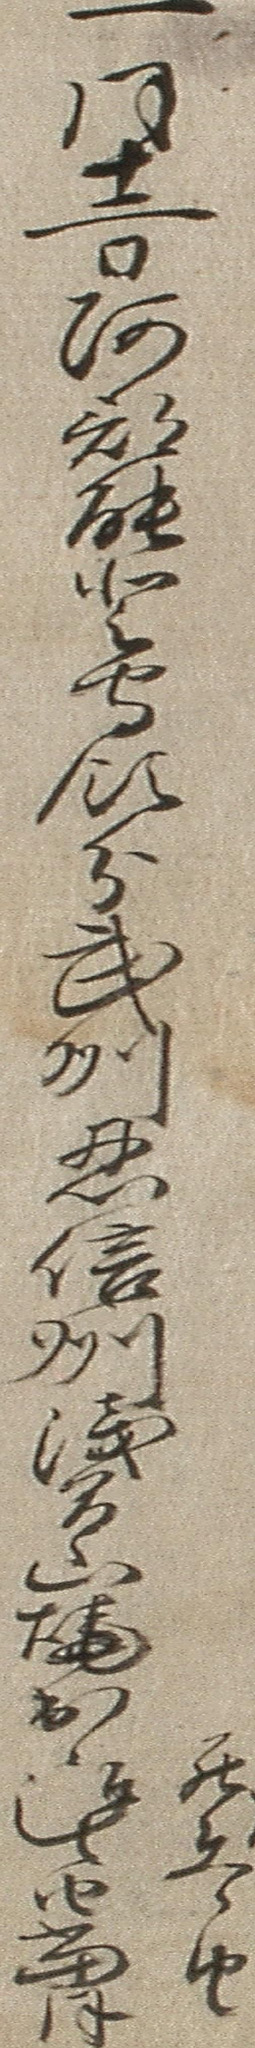一同十二日阿部能登之守領分武州忍信州浅間山焼出候趣之由当月
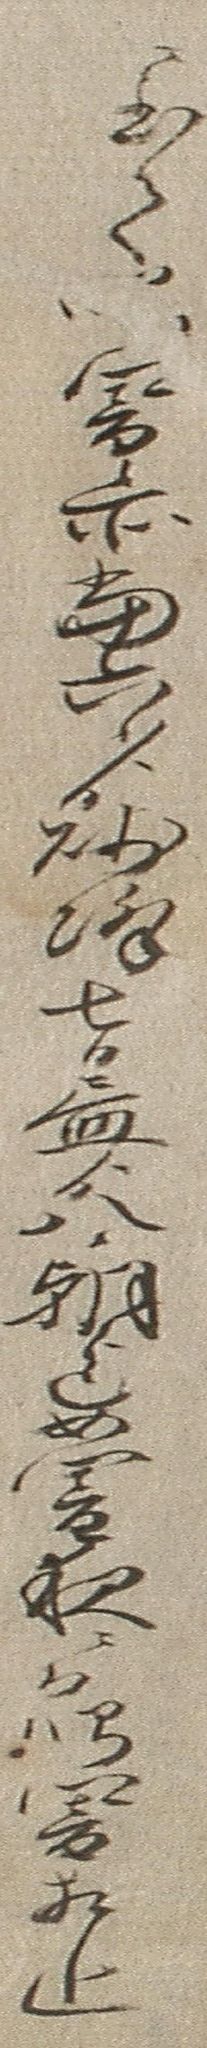二至テ鳴響候所当六日ゟ砂降七日昼ゟ八日朝迄如闇夜に而鳴響相止
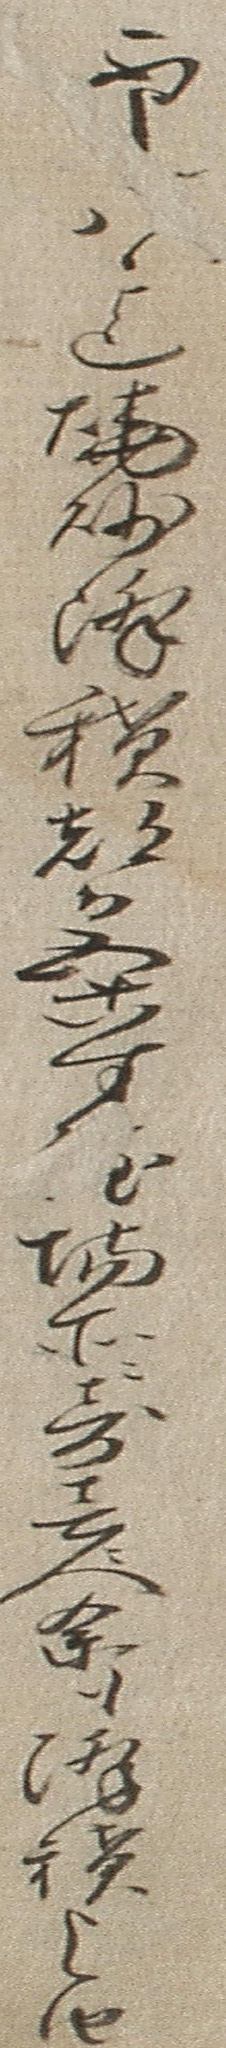不申八日迄焼砂降積都而五六寸程場所に寄壱尺余も降積申候由
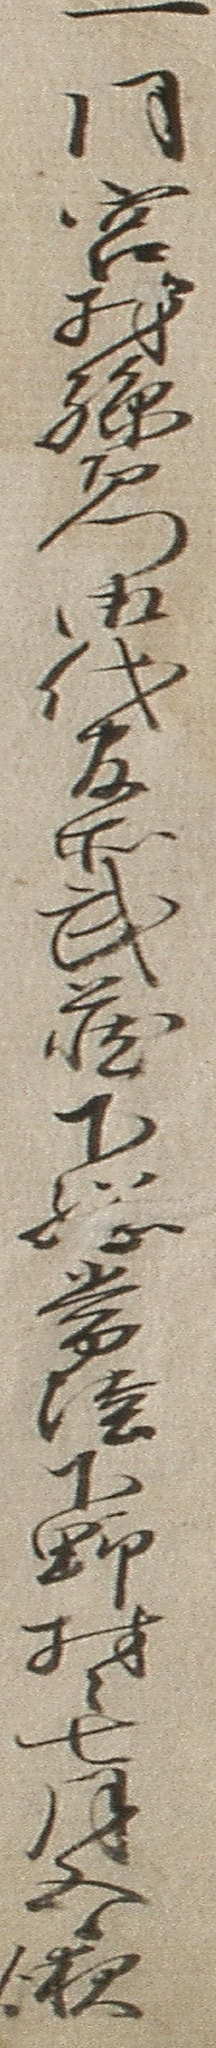一同宮林孫右衛門御代官所武蔵下総常陸下野村々七月五日夜ゟ
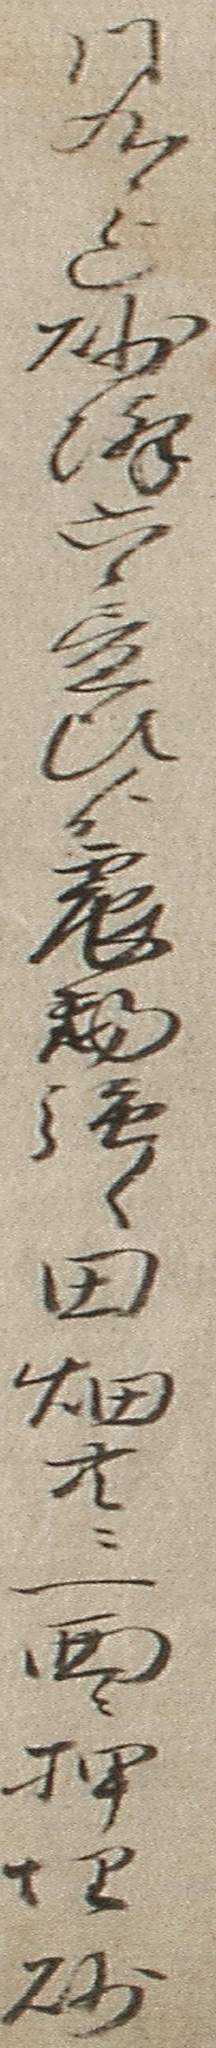同九日迄砂降六日昼頃ゟ震動強く田畑共に一面に押埋砂
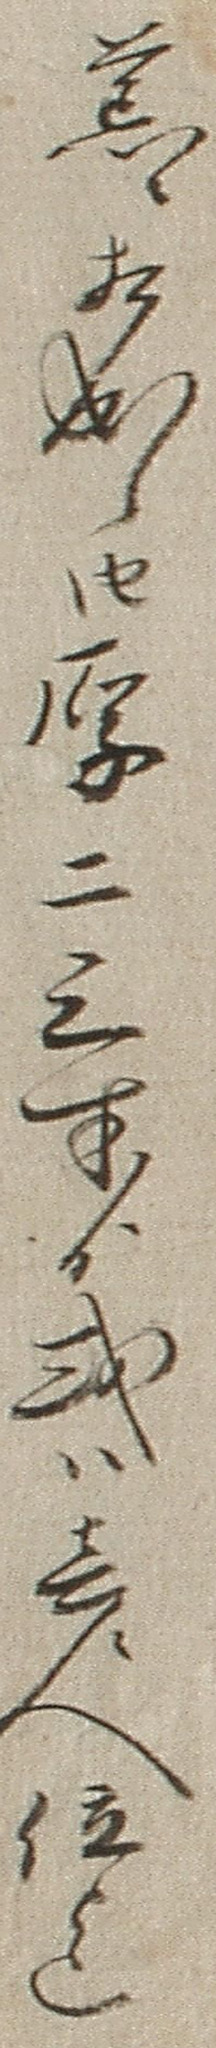荒に相成候由厚二三寸ゟ或は壱尺位迄

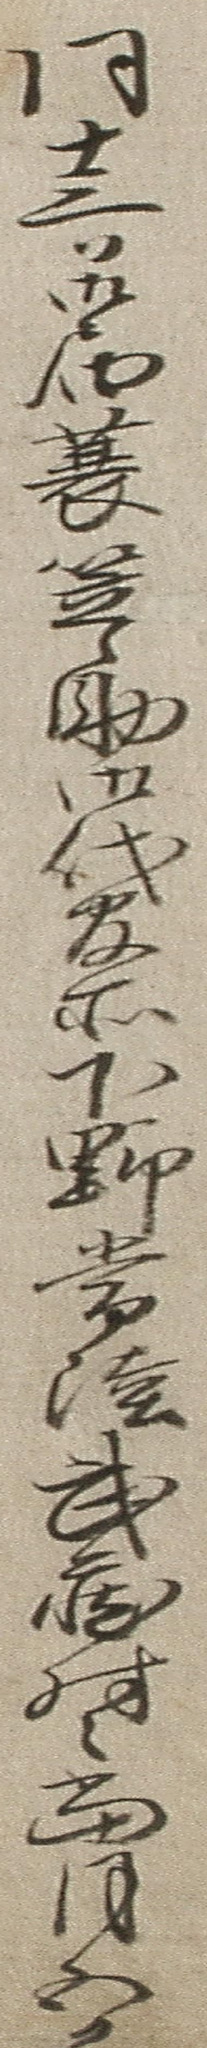一同十三日御届蓑笠之助御代官所下野常陸武蔵村々当月五日
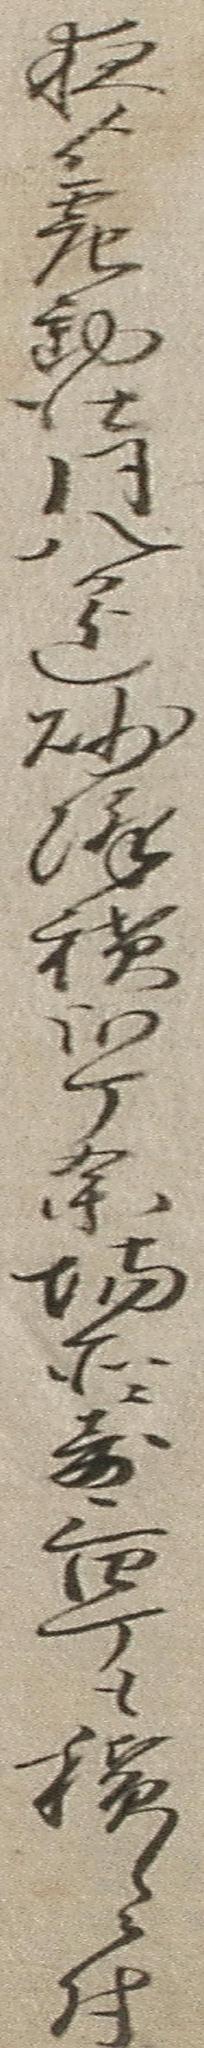夜ゟ震動仕同八日迄砂降積弐丁余場所に寄三四丁も積候に付
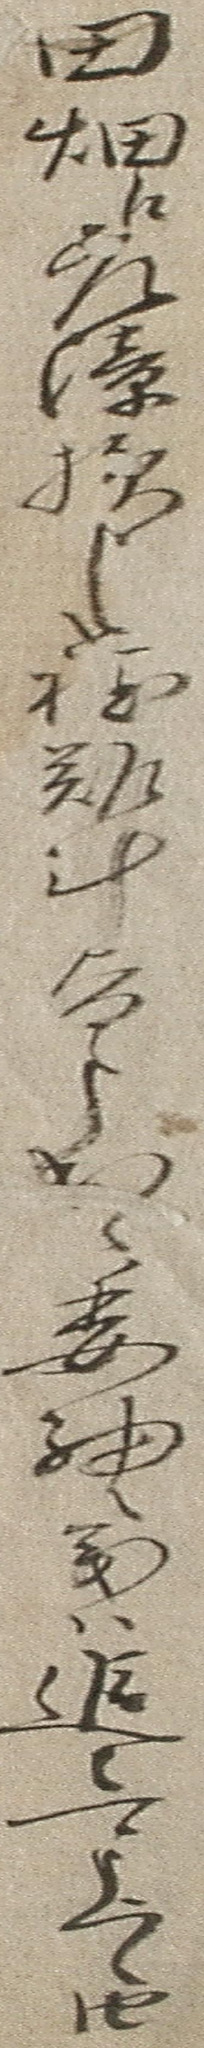田畑江差障損申候程難計旨申出候委細之義は追々可申上候由
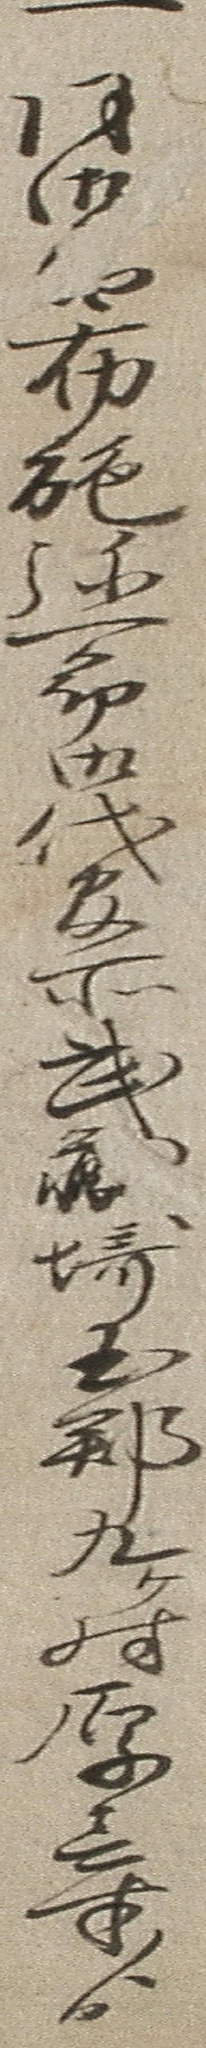一同御布施弥一郎御代官所武蔵埼玉郡九ヶ村厚壱寸ゟ
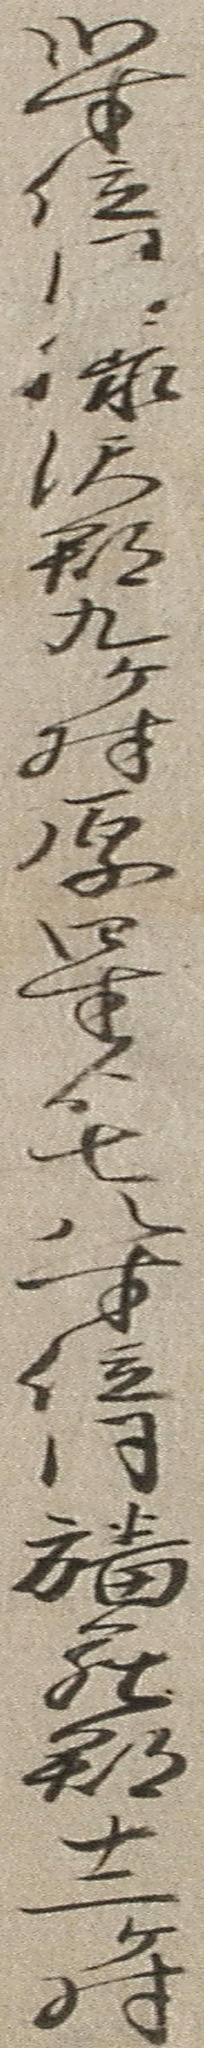弐寸位同榛沢郡九ヶ村厚四寸ゟ七八寸位同旛羅郡十二ヶ村
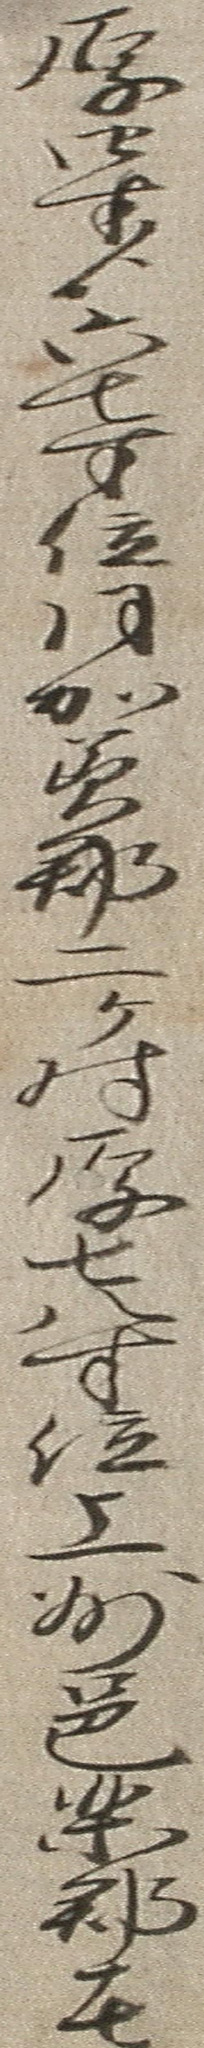厚四寸ゟ六七寸位同加美郡二ヶ村厚七八寸位上州邑楽郡十七
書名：太平秘録抜書　浅間山燒及普賢山崩
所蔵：東京大学地震研究所図書室 Earthquake Research Institute Library, The University of Tokyo, JAPAN
